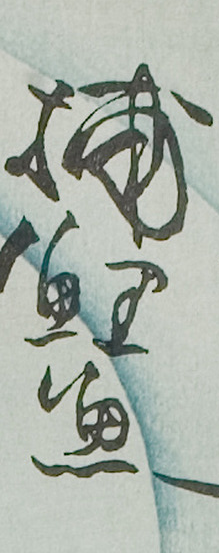捕鯉魚
